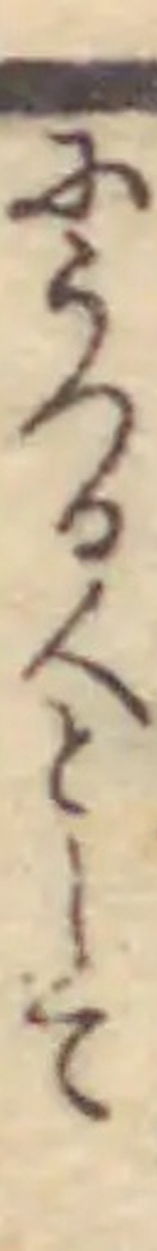にうつる人として
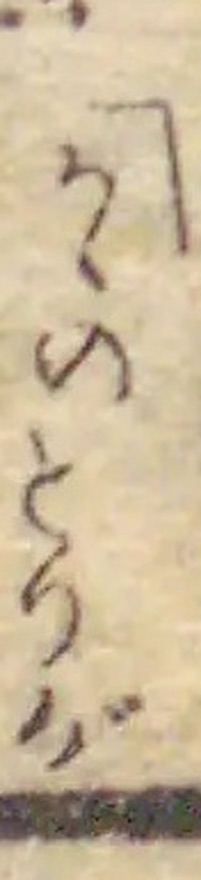かゝのとりが
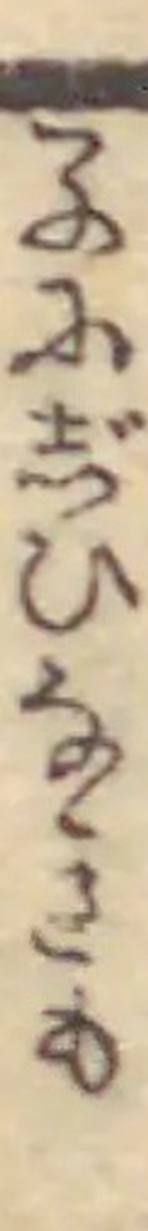子にじひなきも
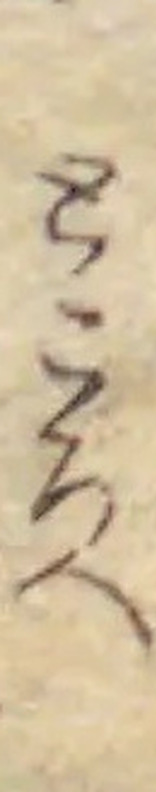ところへ
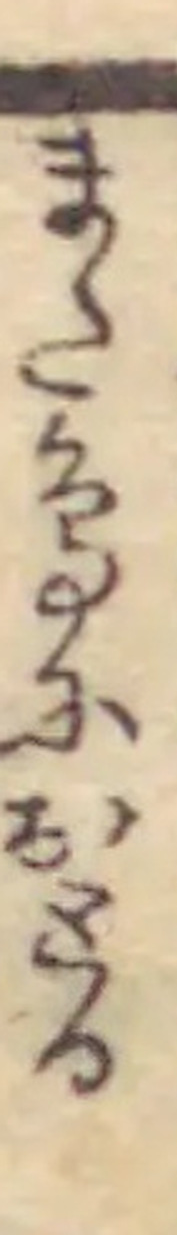また鳥におとる
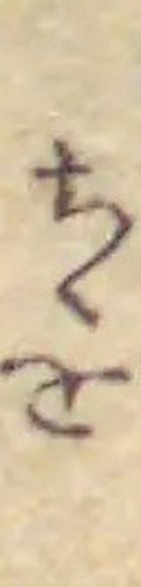ちゝを
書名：児訓影絵喩 3巻
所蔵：国立国会図書館 National Diet Library, JAPAN
